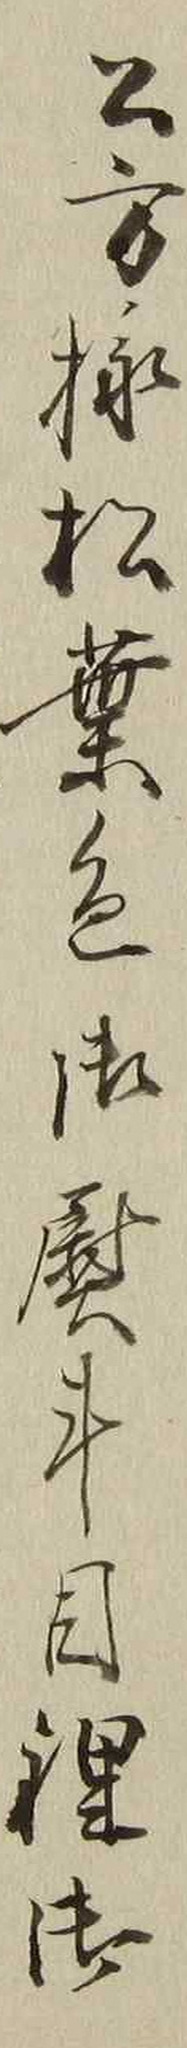公方様松葉色御熨斗目裏御
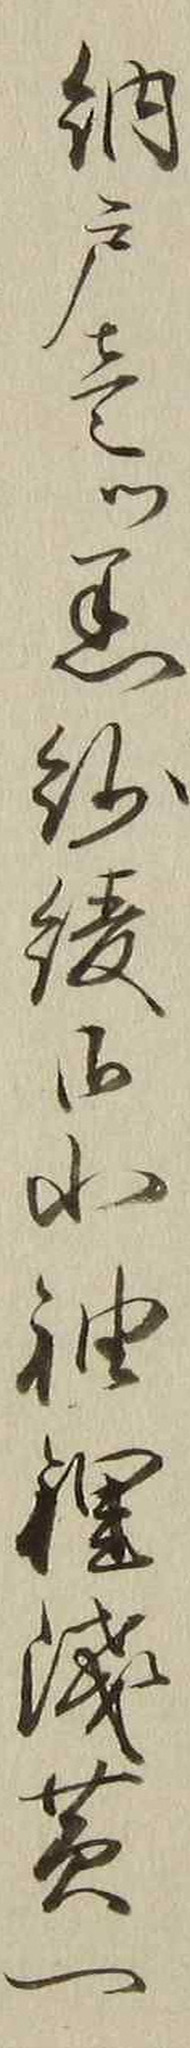納戸壱つ黒紗綾御小袖裏浅黄一
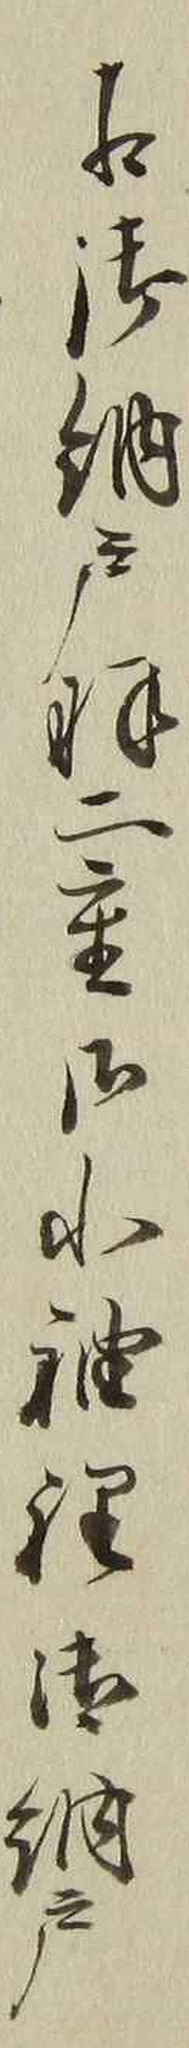古御納戸羽二重御小袖裏御納戸
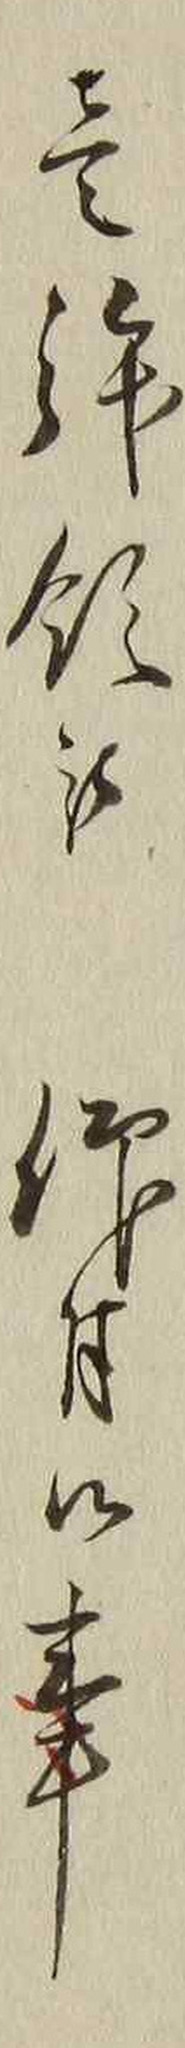壱拝領被仰付候事
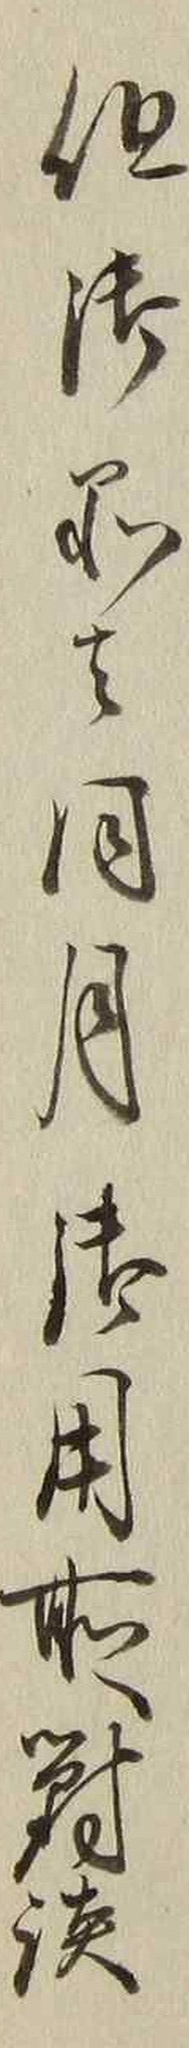但御品は同月御用所へ対談
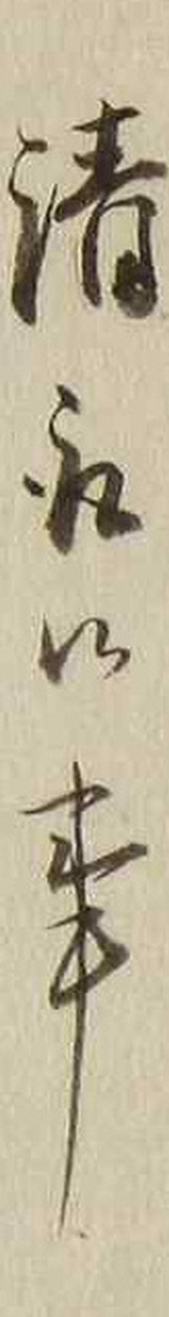請取候事
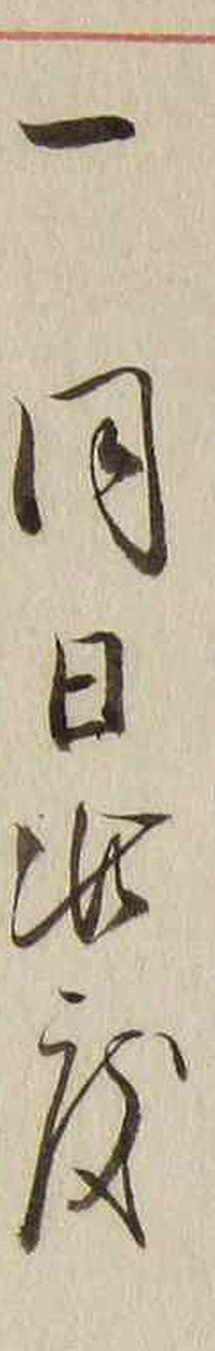一同日此度
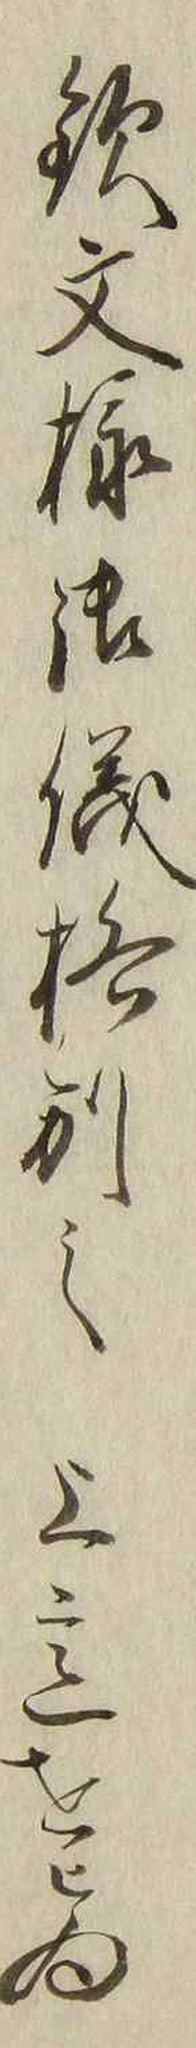欽文様御儀格別之上意を被為
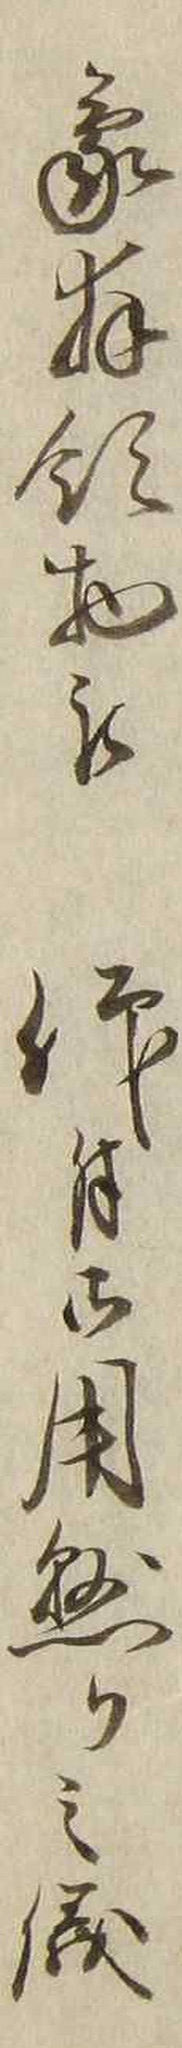蒙拝領物被仰付御用懸り之儀

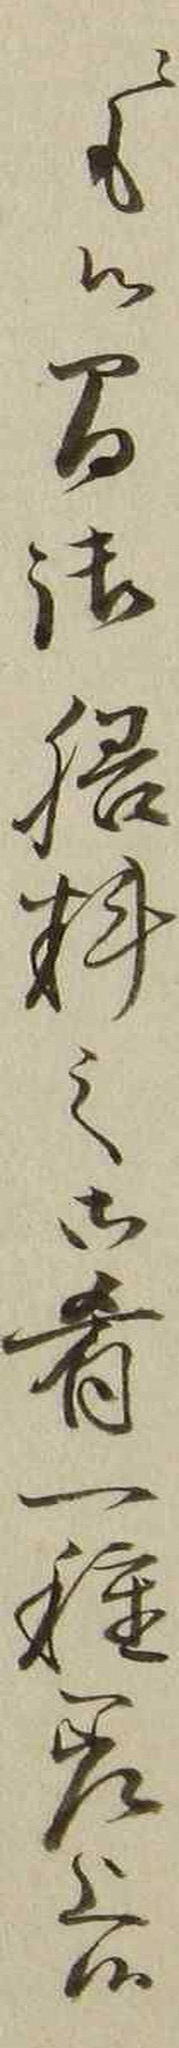にも候間御膳料之御肴一種差上候
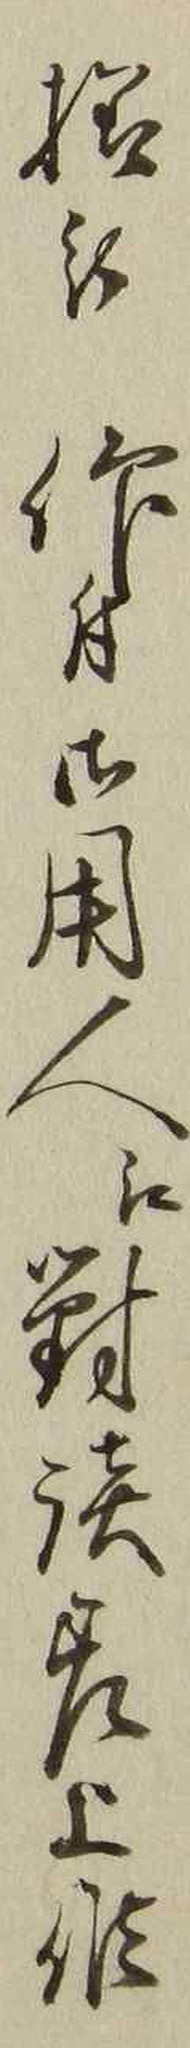様被仰付御用人江対談差上候
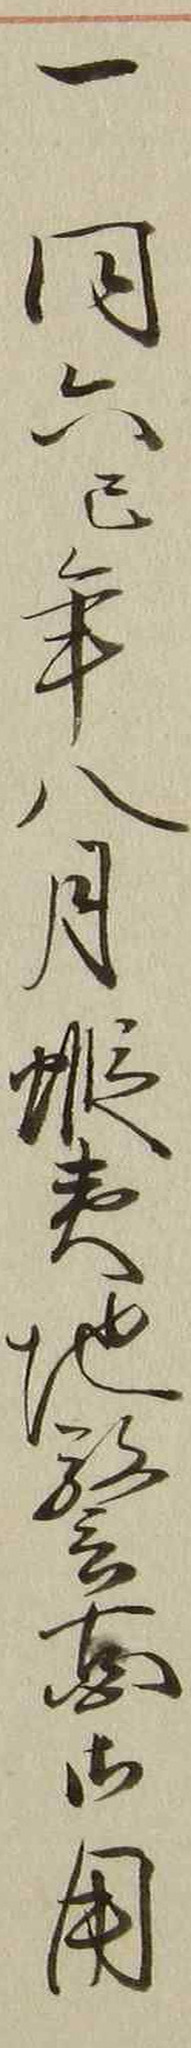一同六巳年八月蝦夷地警固御用
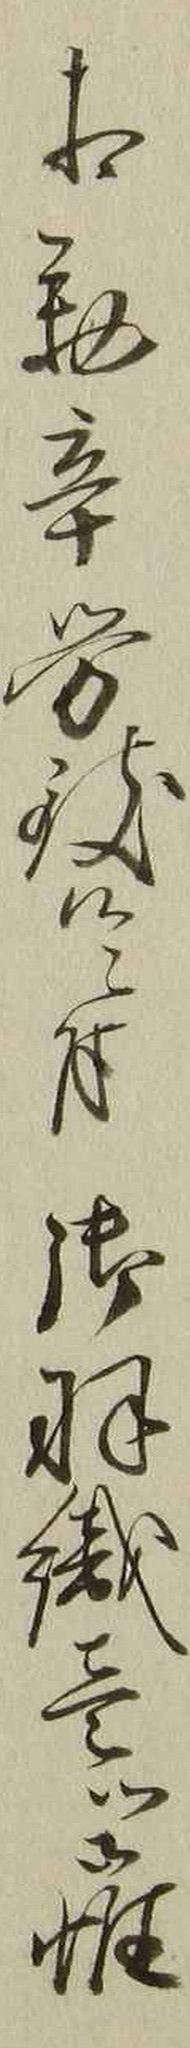相勤辛労致候に付御羽織壱御帷
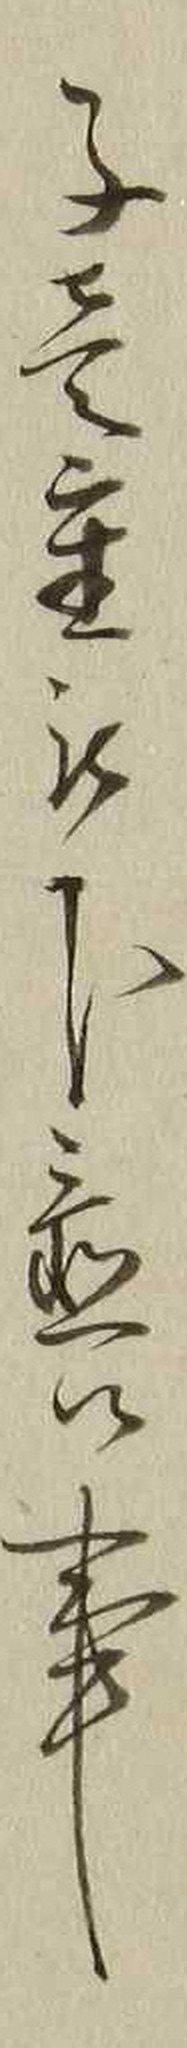子壱重被下置候事
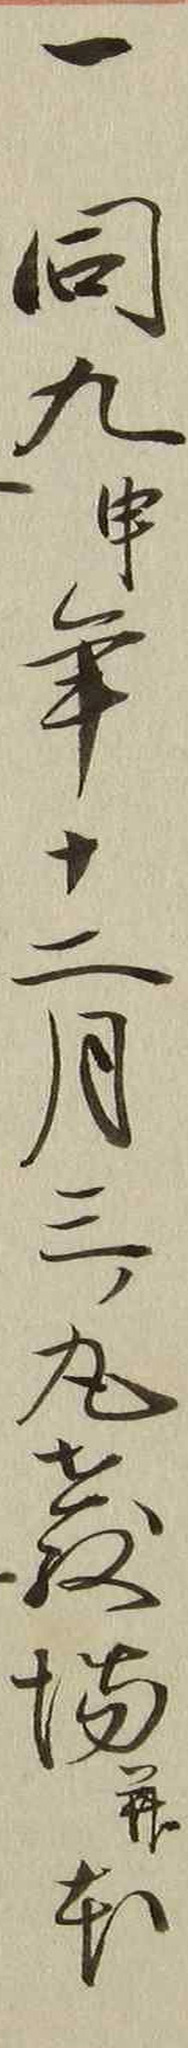一同九申年十二月三ノ丸教場并本
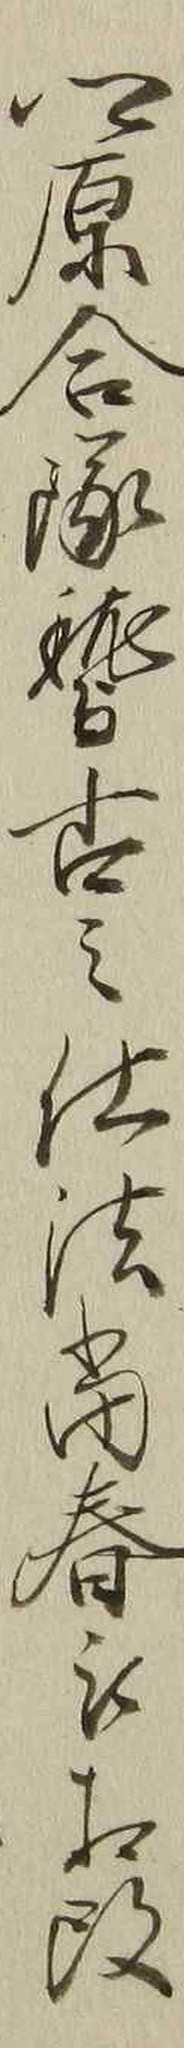郷原合隊稽古之仕法当春被相改
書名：諸士系譜　巻之103　か之部11
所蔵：会津若松市立会津図書館
